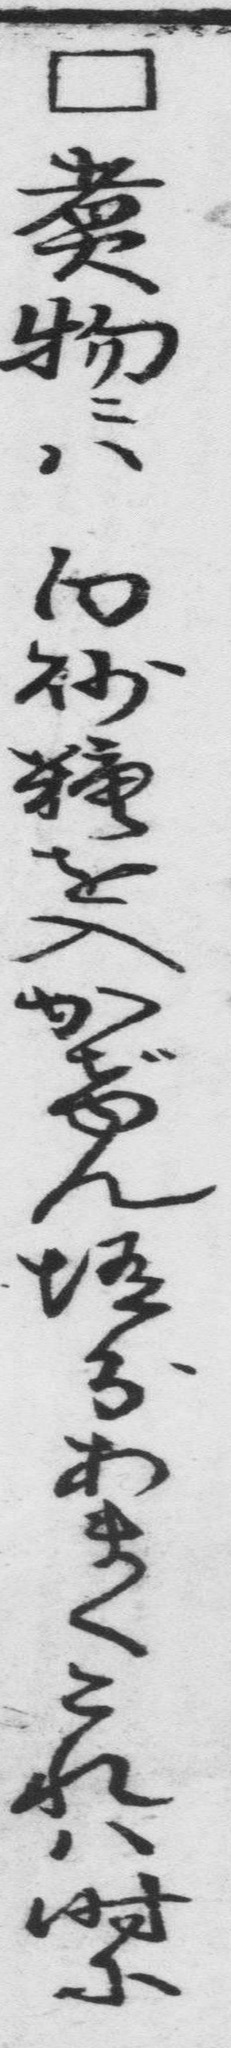▢煮物には白砂糖を入りかげん随分あまくこれは時尓
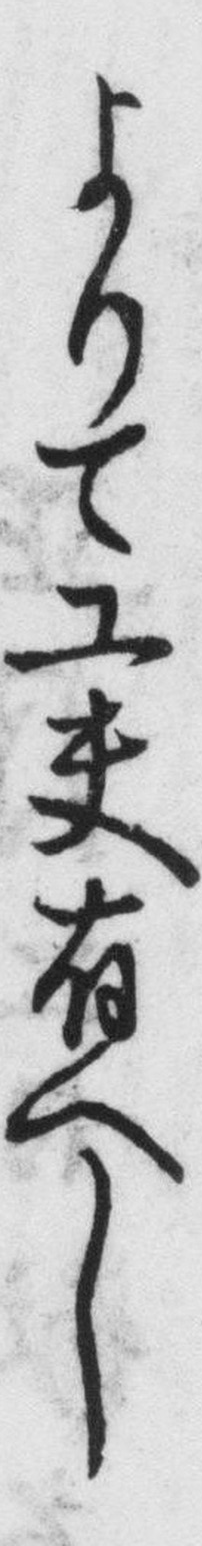よりて工夫有へし

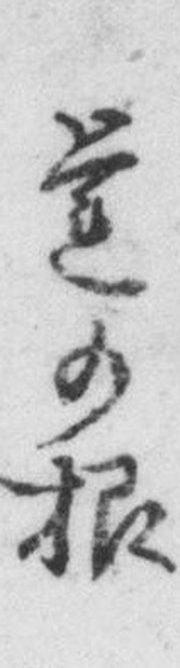蓬の根
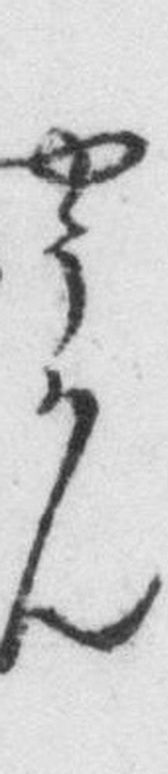やうかん
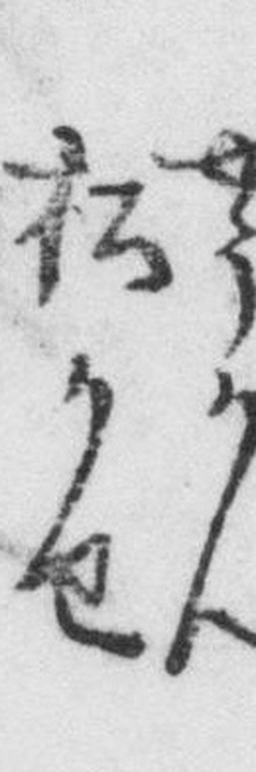松かせ
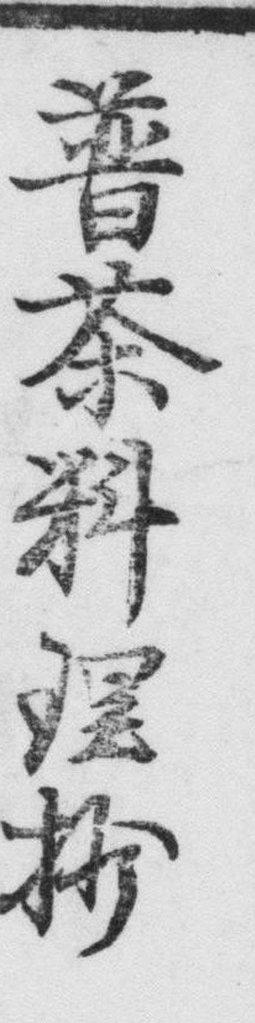普茶料理抄
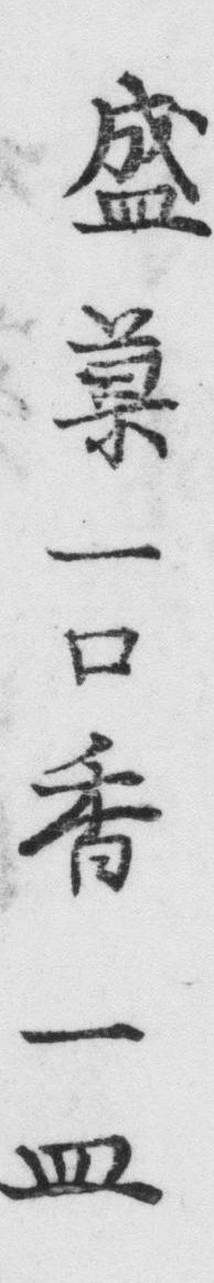盛菓一口香一皿
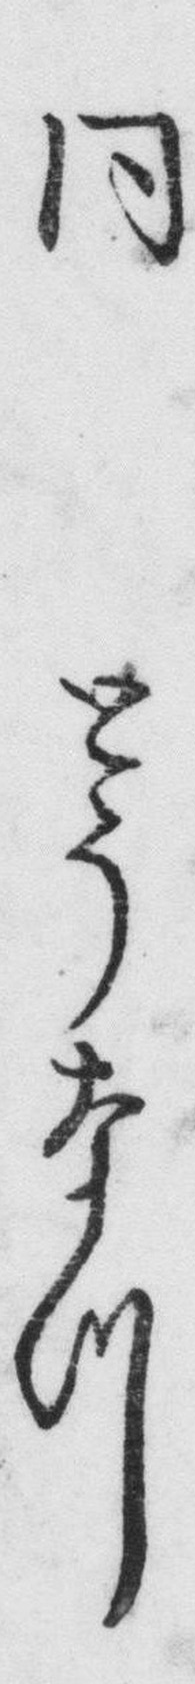同とうな川
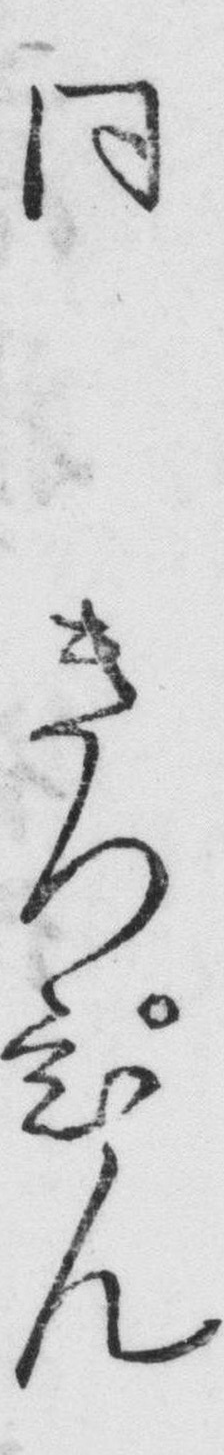同きつぴん
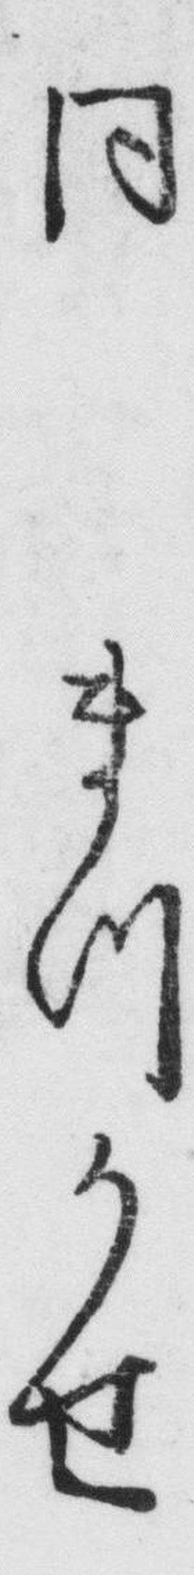同ま川かせ

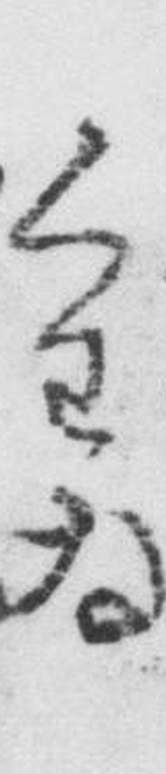くわゐ
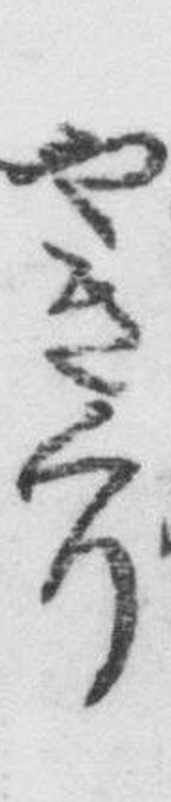やきくり
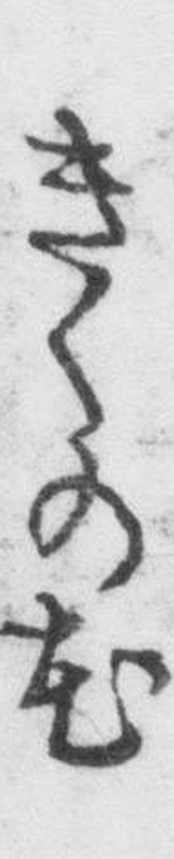きくの花

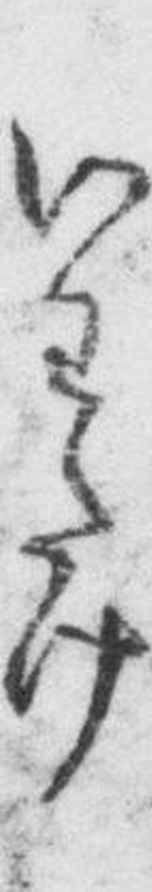いわたけ
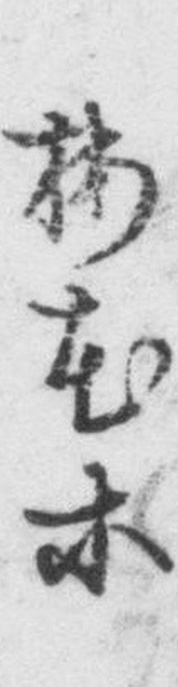梅花等
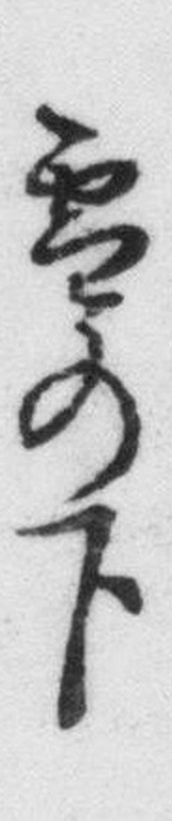雪の下
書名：普茶料理抄
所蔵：大阪府立大学学術情報センター 国文学研究資料館
